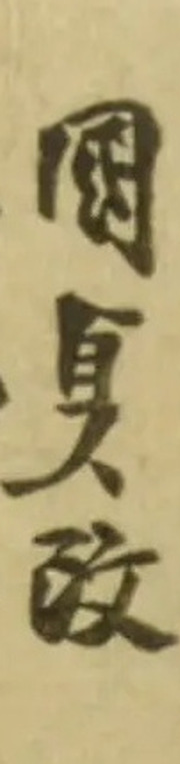国貞改
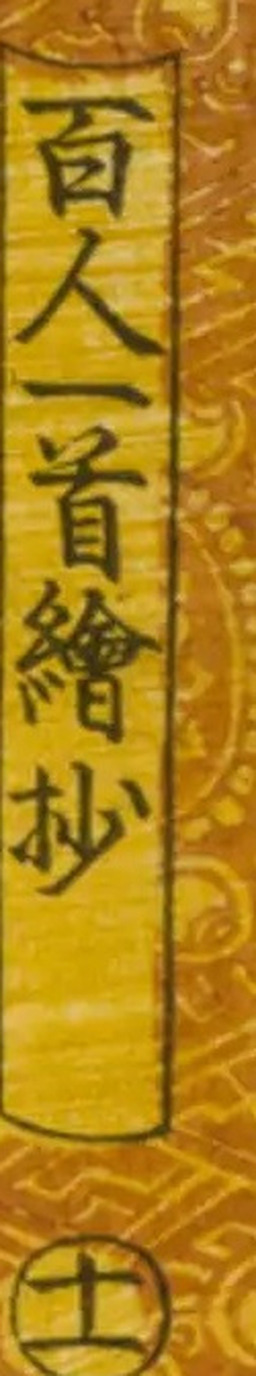百人一首絵抄十一
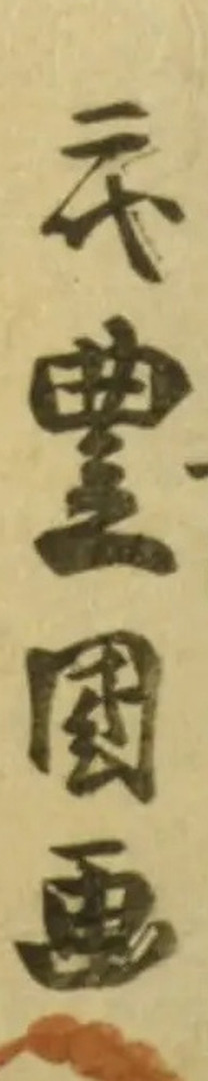二代豊国画
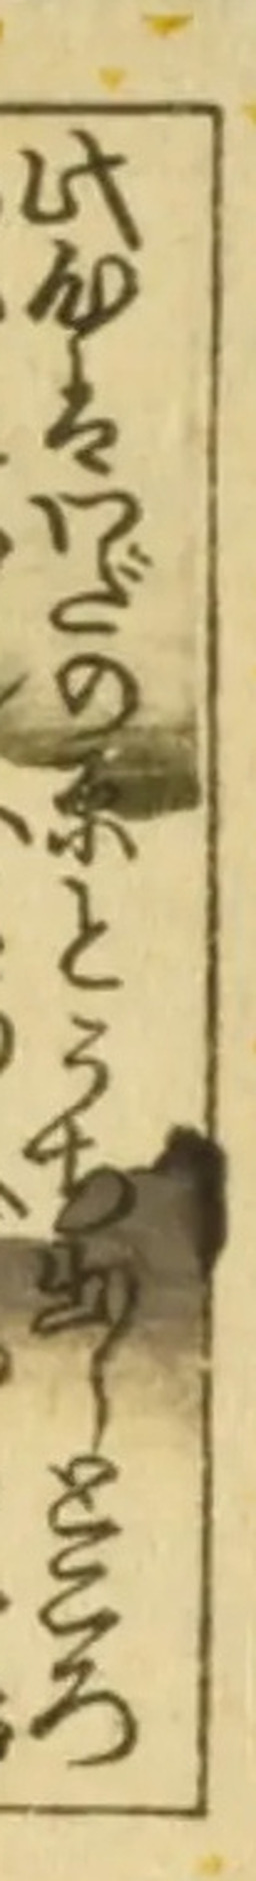此心はわだの原とうち出しところ
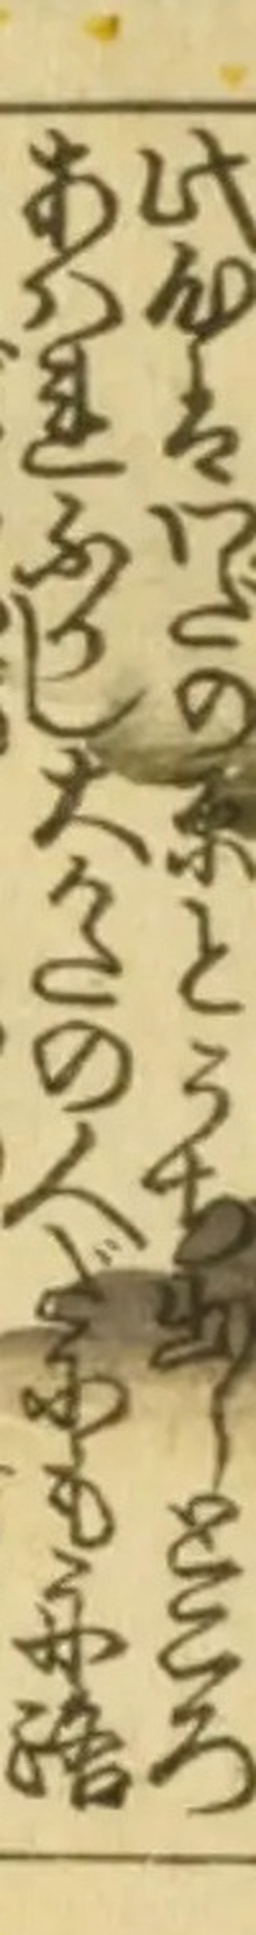あはれふかし大かたの人だにも舟路
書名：百人一首絵抄　十一　参議篁
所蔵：国立国会図書館 National Diet Library, JAPAN
